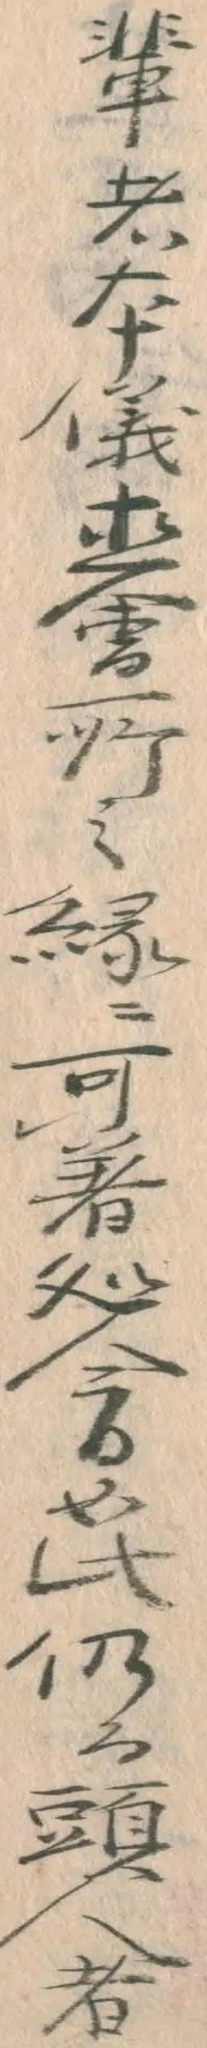輩者本儀直會所之縁ニ可着処今日如此仍而頭人者
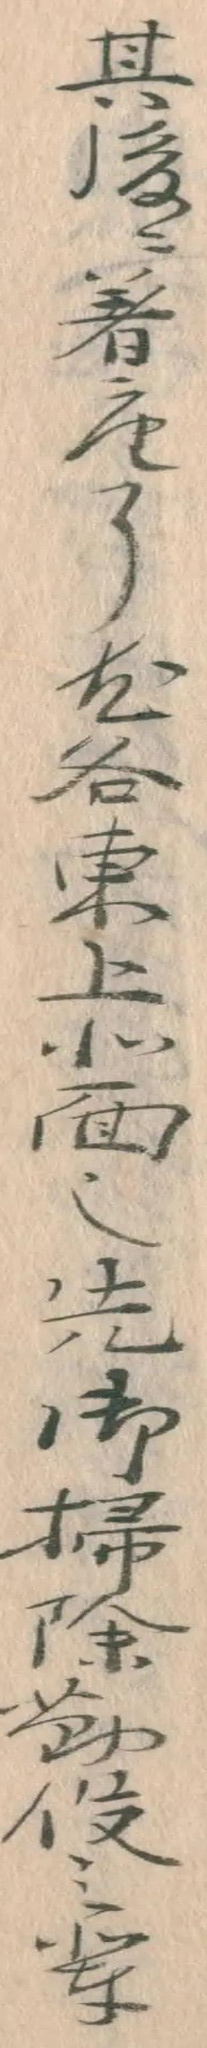其後ニ着座了尤各東上北面也先御掃除勤役之輩
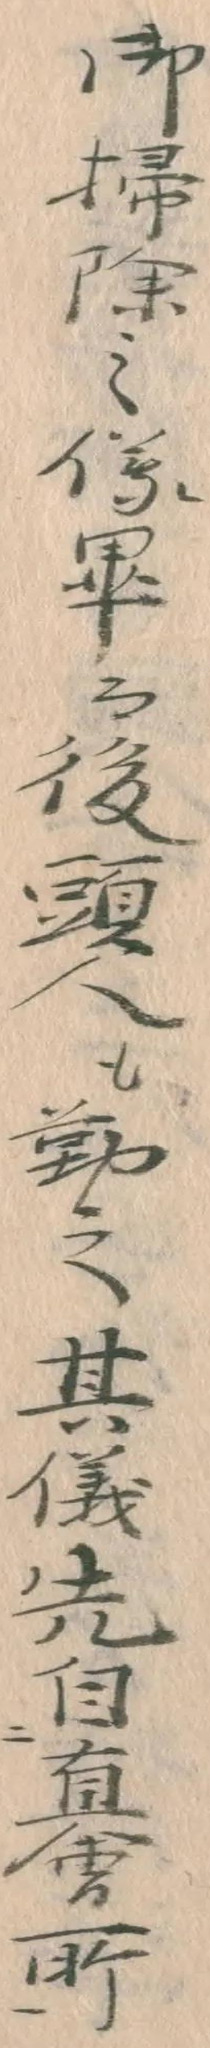御掃除之儀畢而後頭人も勤之其儀先自直會所
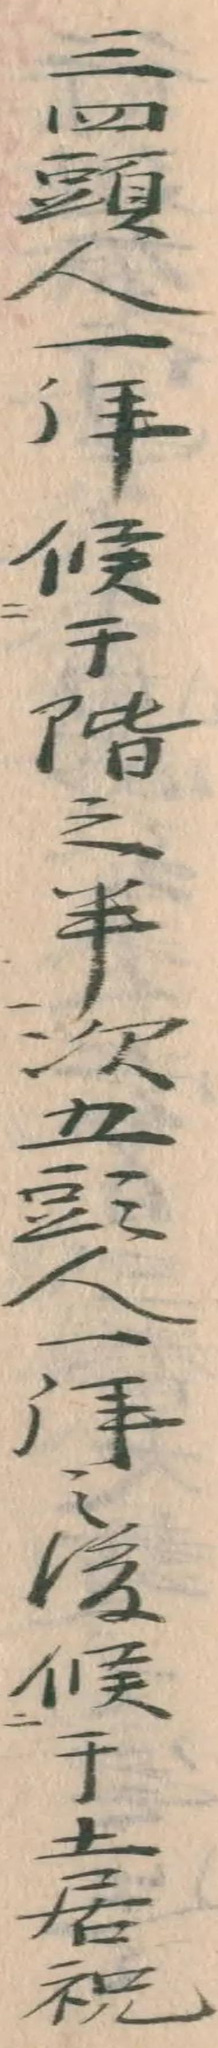三四頭人一拝候于階之半次五頭人一拝之後候于土居祝
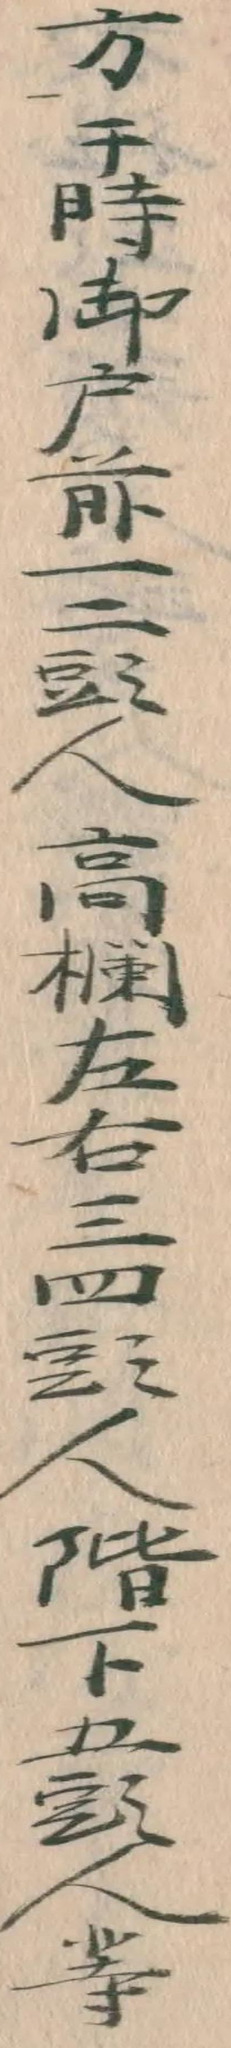方于時御戸前一二頭人高欄左右三四頭人階下五頭人等
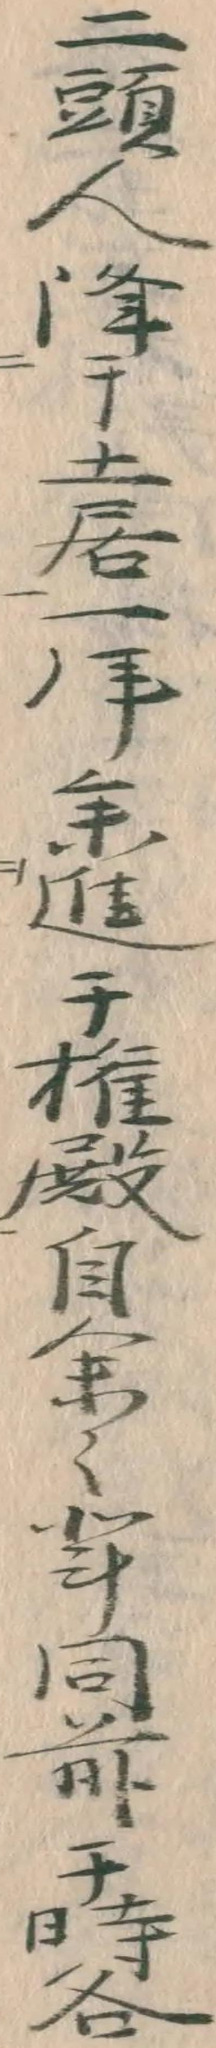二頭人降于土居一拝参進于権殿自余之輩同前于時各
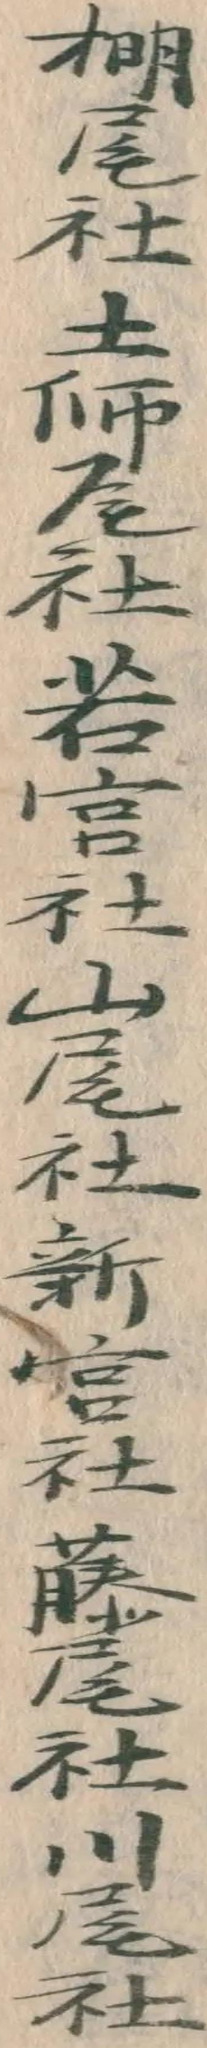棚尾社土師屋社若宮社山尾社新宮社藤尾社川尾社
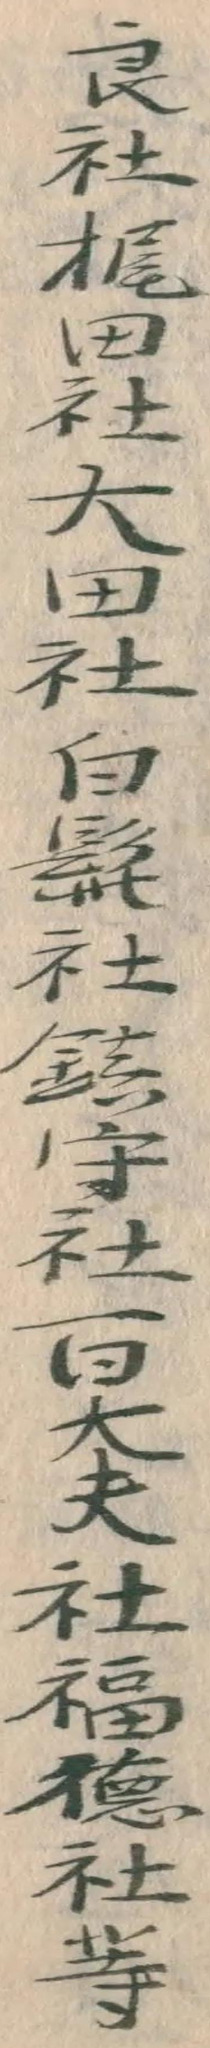良社梶田社大田社白髭社鎮守社百大夫社福徳社等
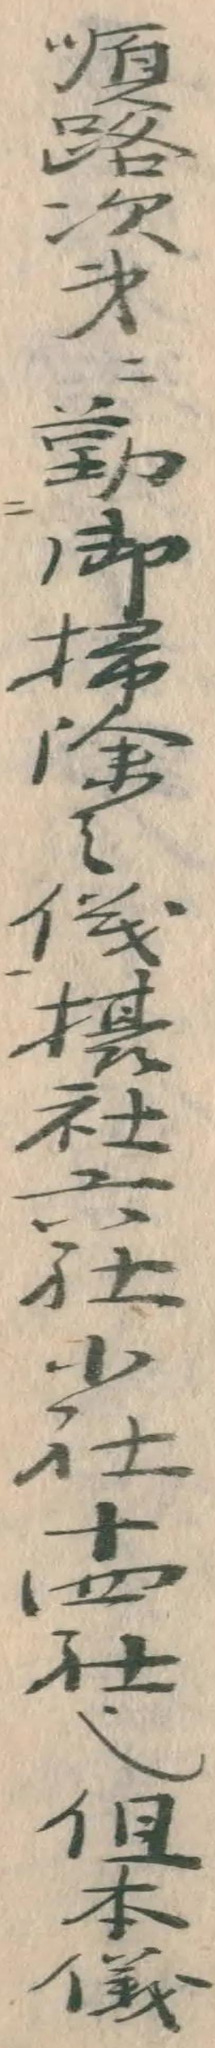順路次第ニ勤御掃除之儀摂社六社小社十四社也但本儀
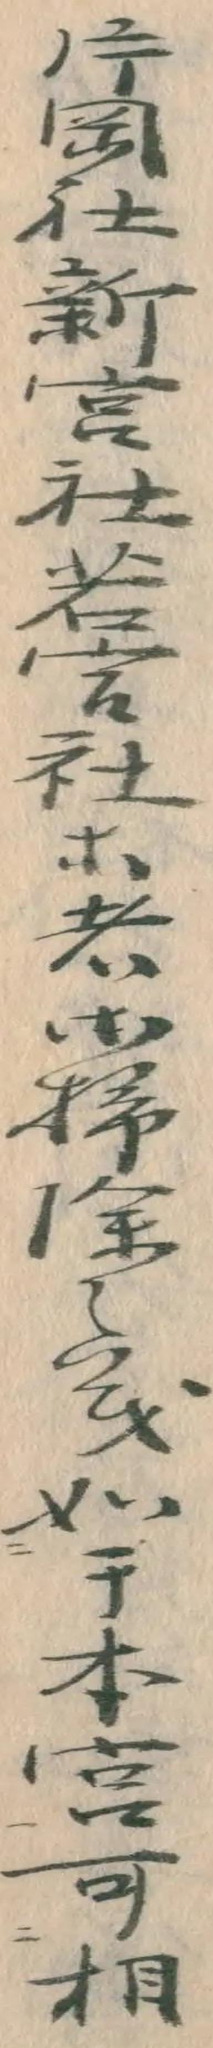片岡社新宮社若宮社等は御掃除之義如于本宮可相

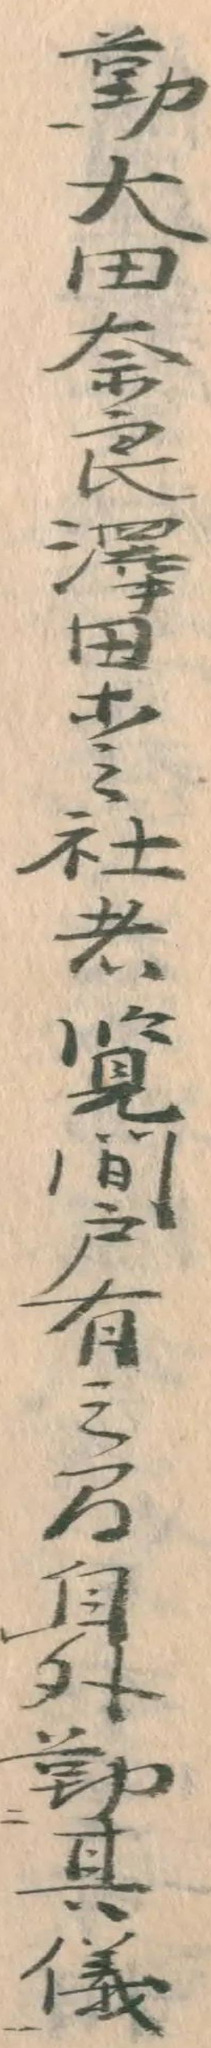勤大田奈良沢田等之社者覧間戸有之間自外勤其儀
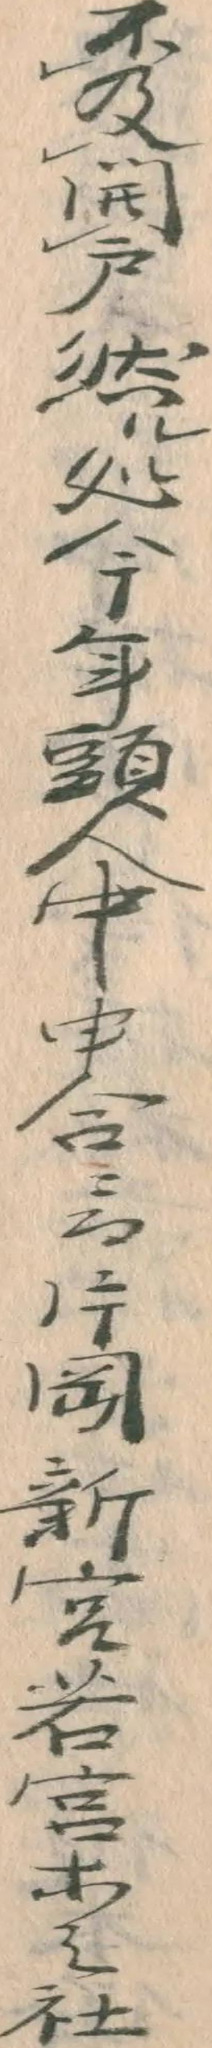不及開戸然ル処今年頭人中申合ニ而片岡新宮若宮等之社
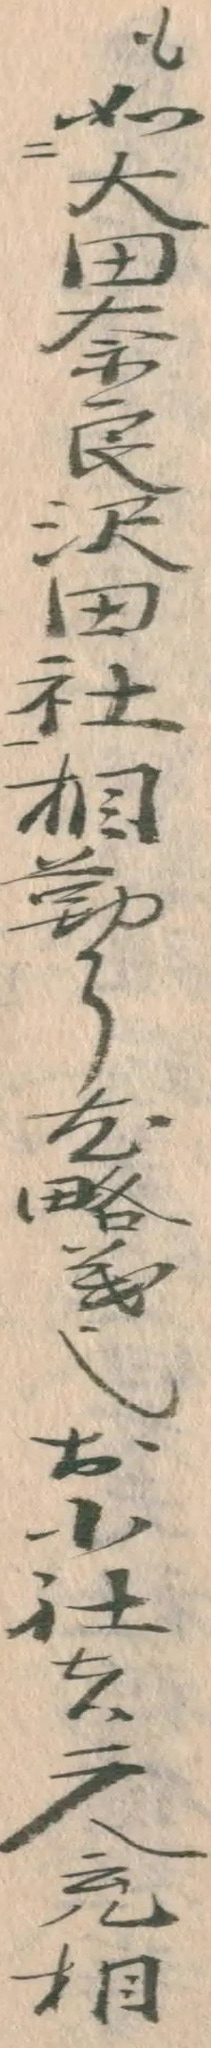も如大田奈良沢田社相勤了尤略義也於小社は二人充相
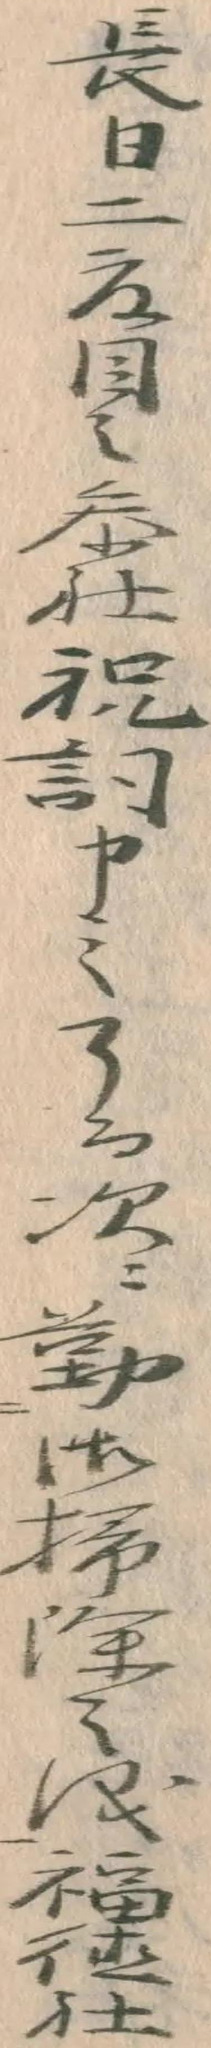長日二度目之参社祝詞申之了而次ニ勤御掃除之儀福徳社仕
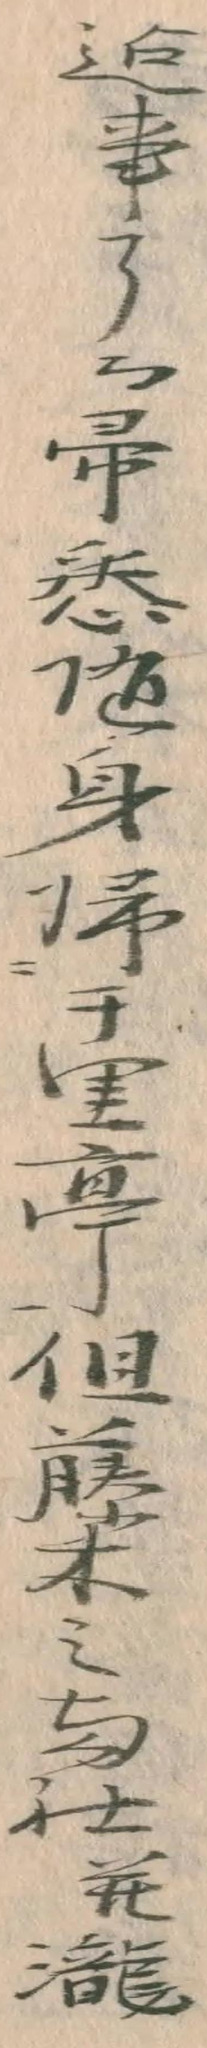迄事了而帚悉随身帰于里亭但藤木之両社并瀧
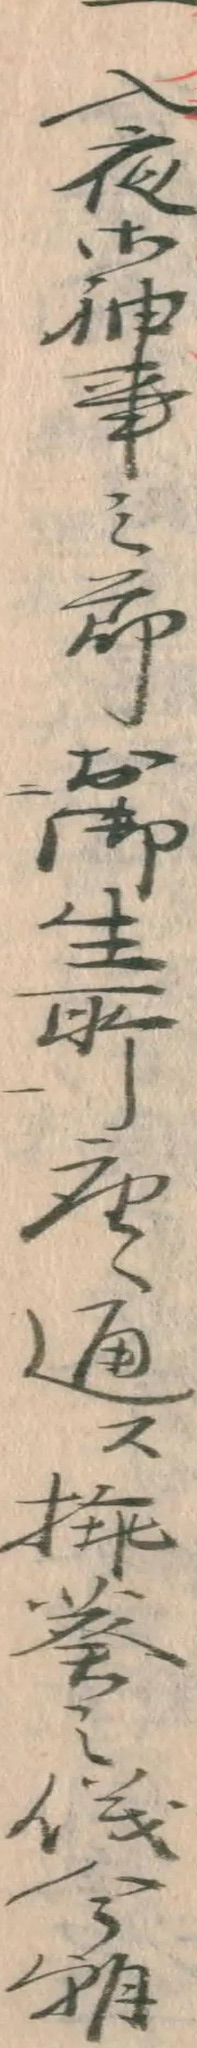一入夜御神事之節於御生所座ヘ通ス挿葵之儀今朝
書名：賀茂社記録. 第73冊
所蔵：国立国会図書館 National Diet Library, JAPAN
